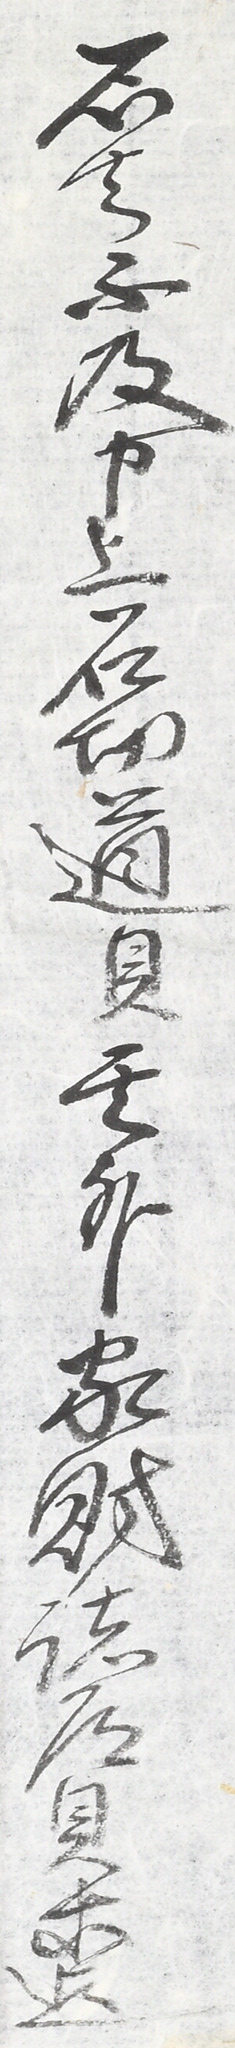石は不及申上石切道具其外家財諸道具等迄
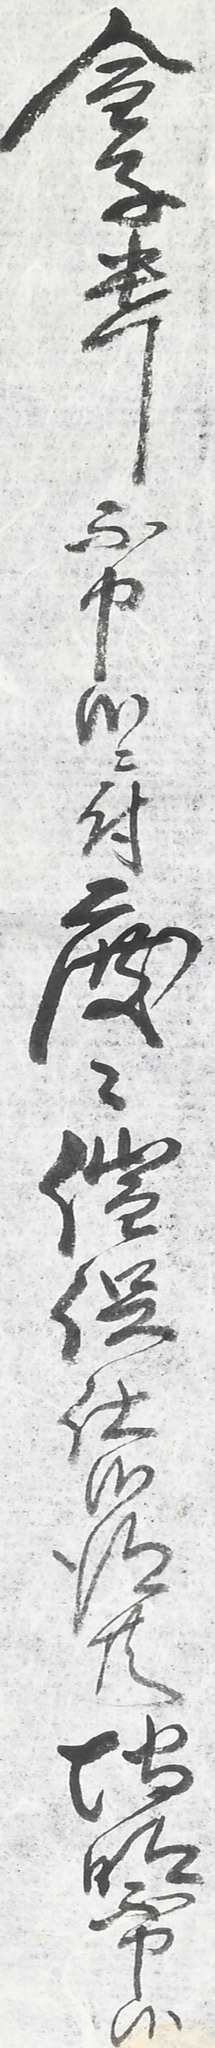金子遣し不申候に付度々催促仕候得共埒明不申候
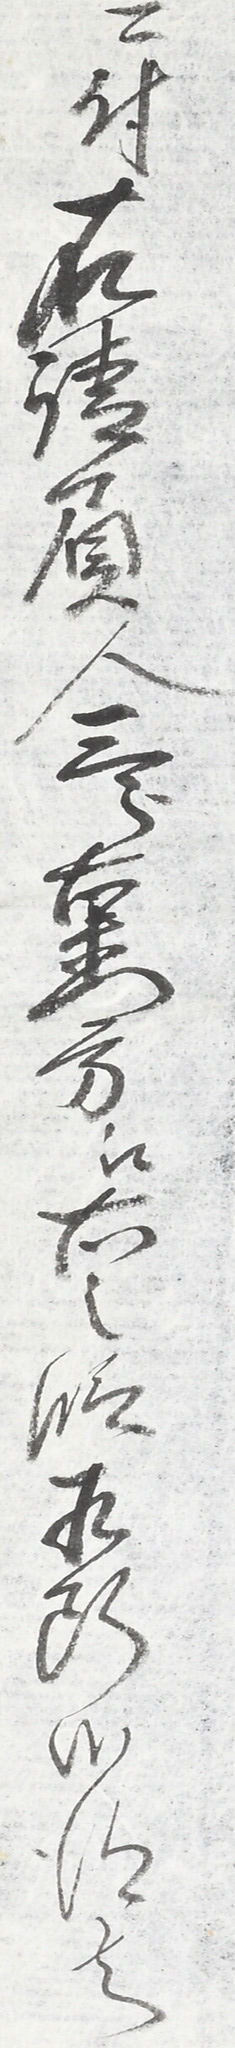に付右請負人三郎右衛門方え右之段相断候得は
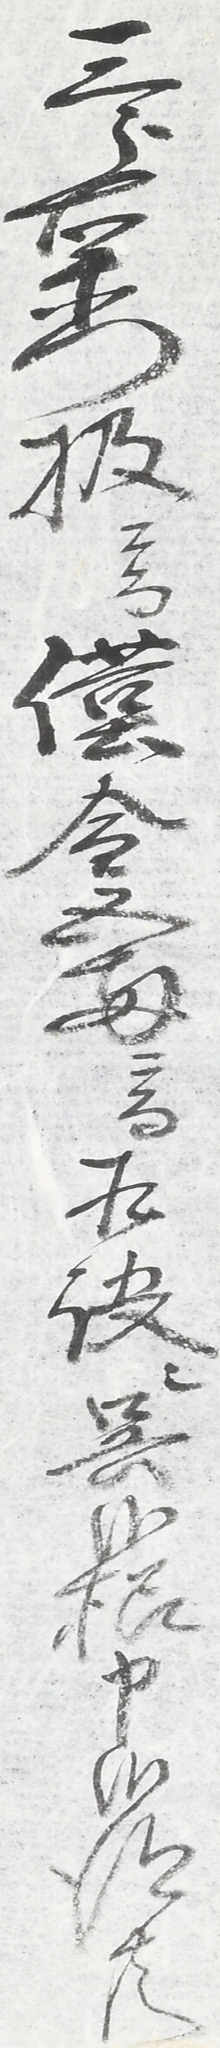三郎右衛門扱にて僅金五両にて相決シ呉候様申候得共
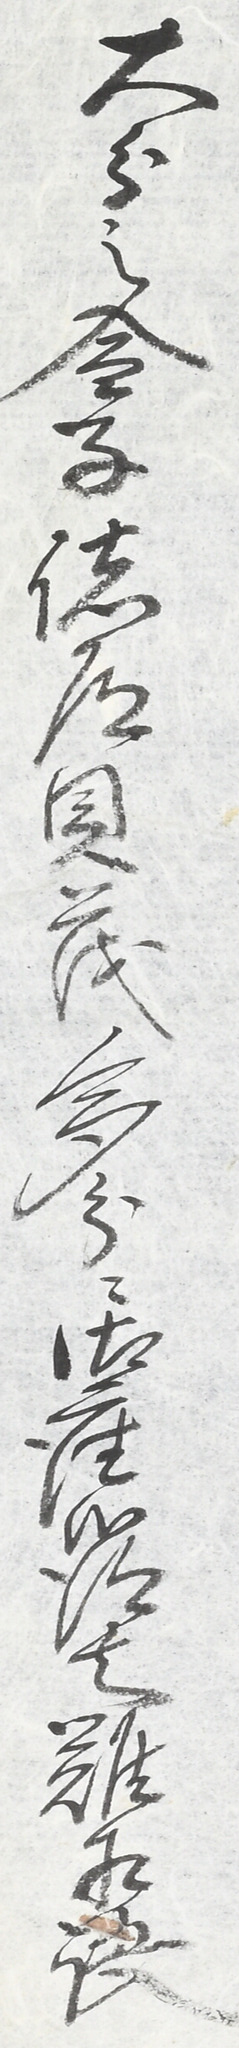大分之金子諸道具も多分に御座候得は難相決
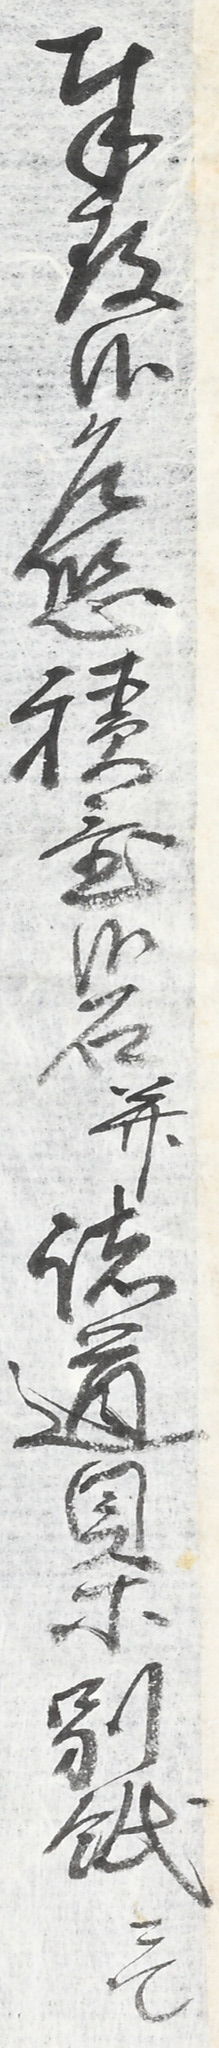奉存候乍恐積置候石幷諸道具等別紙にて
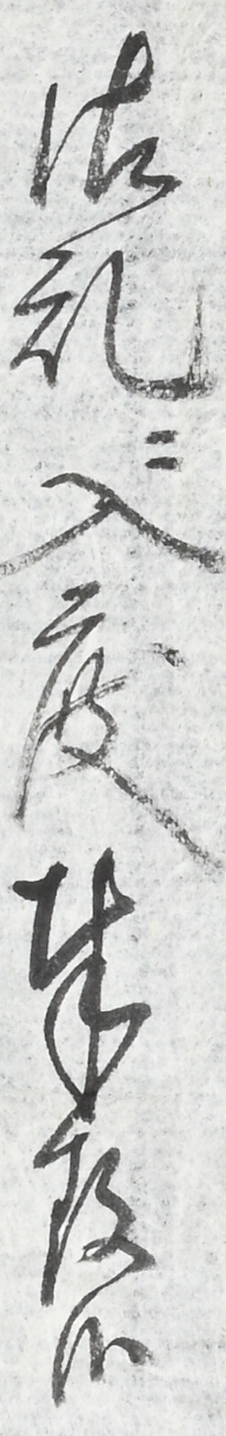御糺に入度奉存候

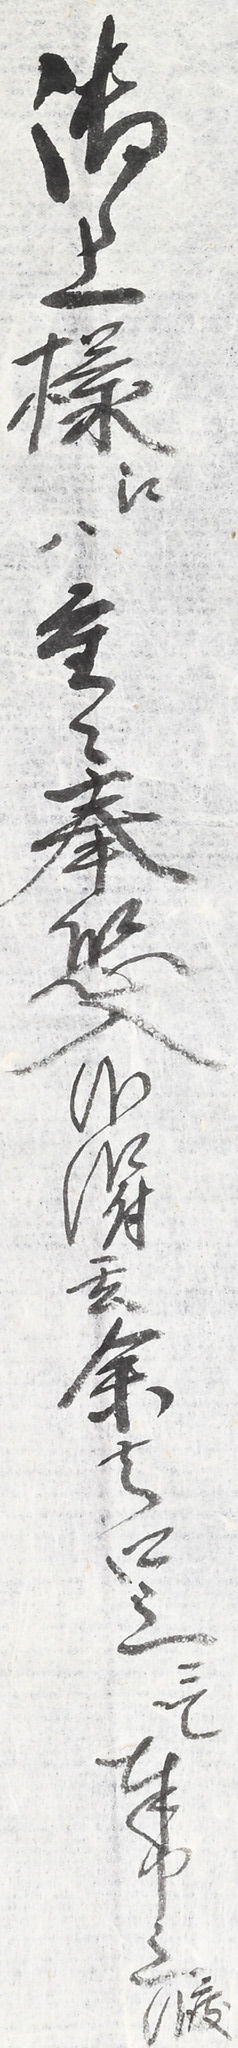御上様えは重々奉恐入候得共余は口上にて奉申上度候
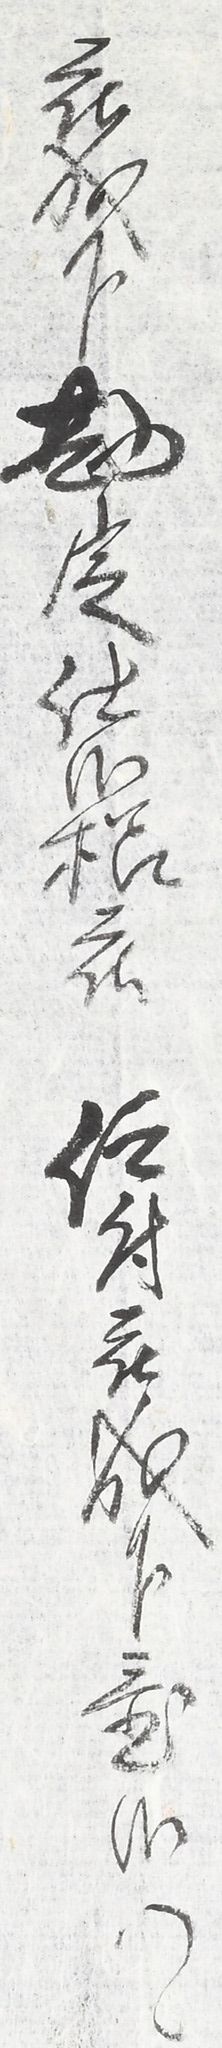被成下勘定仕候様被仰付被成下置候はゝ
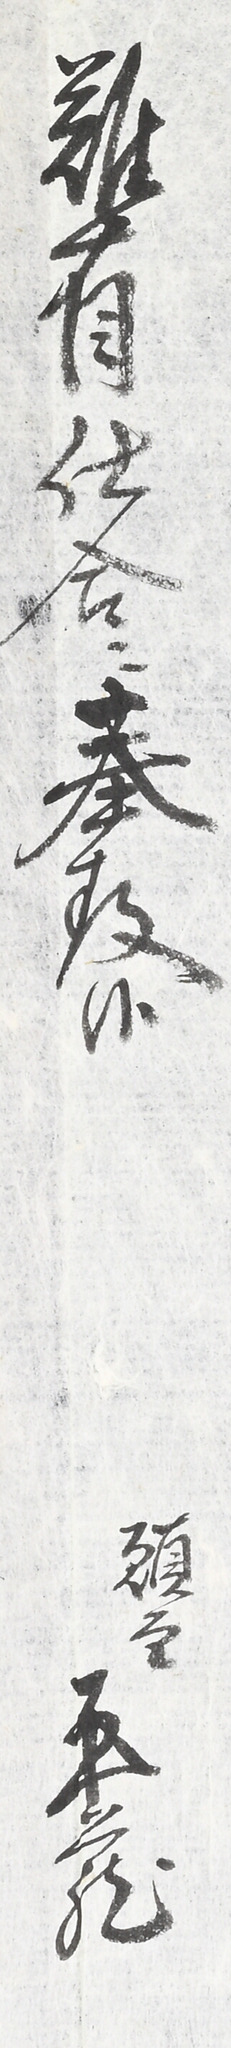難有仕合に奉存候願主
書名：乍恐以書付奉願上候事
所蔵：伊那市立高遠町図書館・合同会社AMANE
